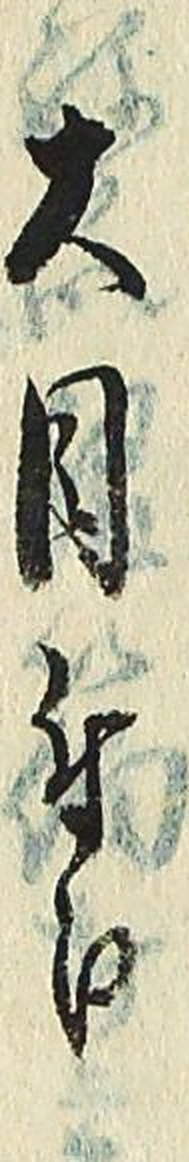大目付江
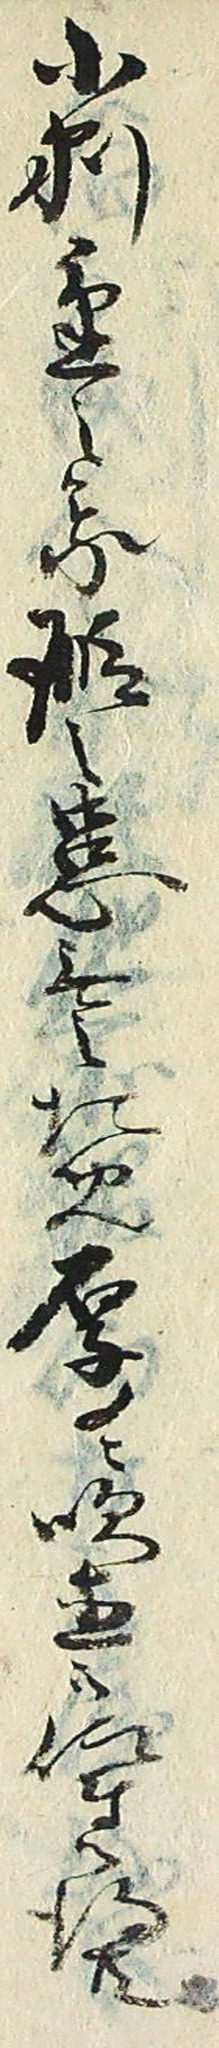小判金之義鍛之患無之ため厚めに吹直被仰付候得共
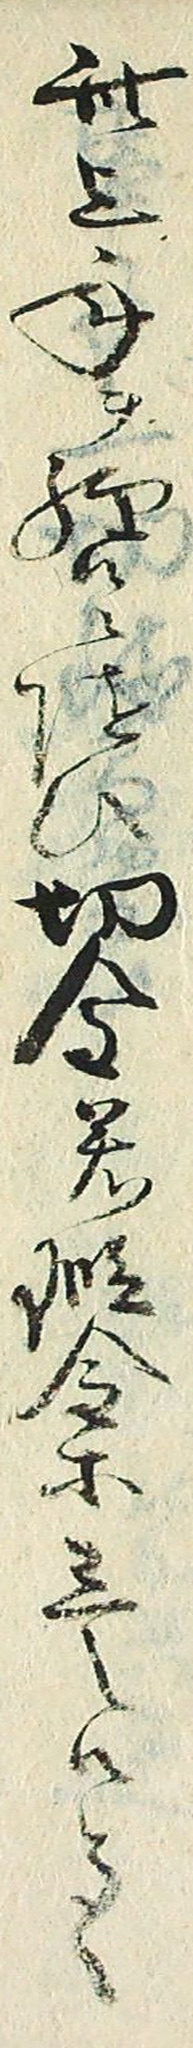此迄年を経候に随ひ切金若鍛金等有之候とも
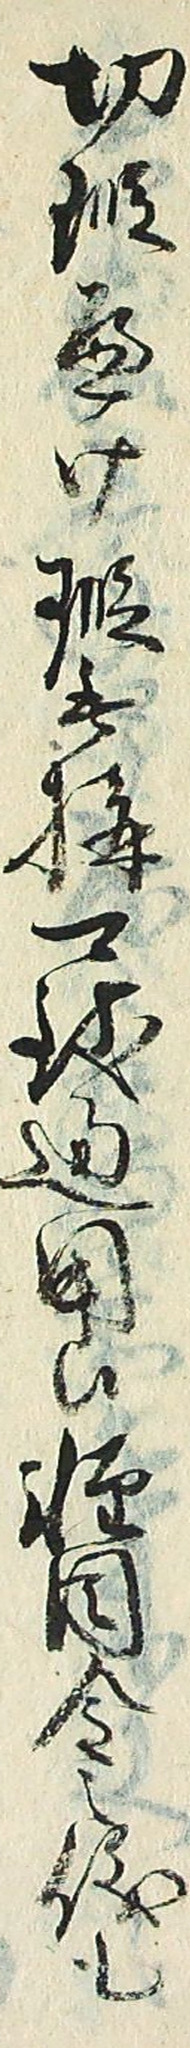切鍛扁け鍛無構可致通用候軽目金之儀も
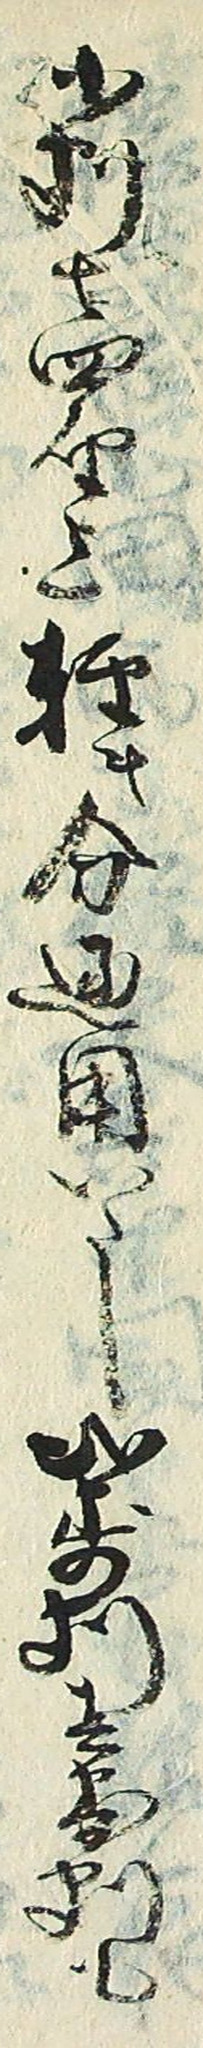小判者四厘迄軽き分通用いたし弐歩判壱歩判も
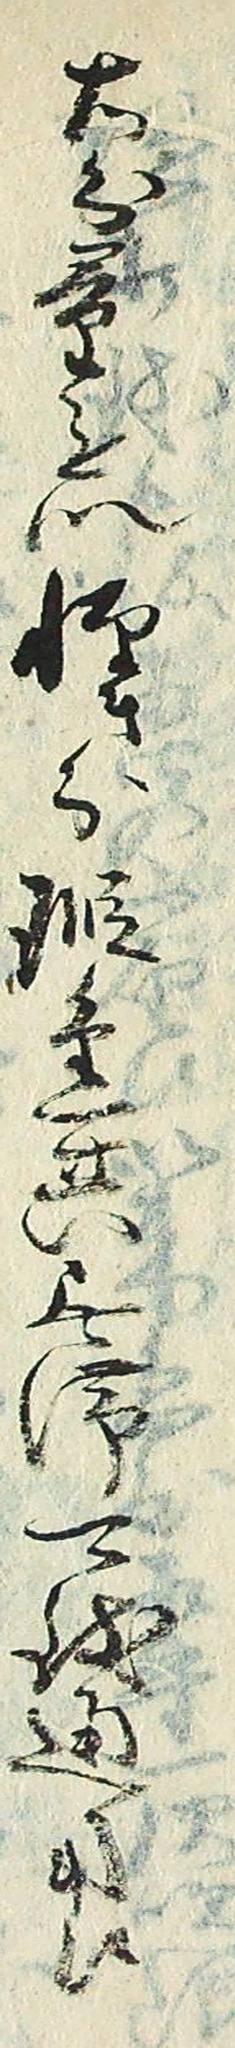右分量を以軽き分鍛金共無滞可致通用候
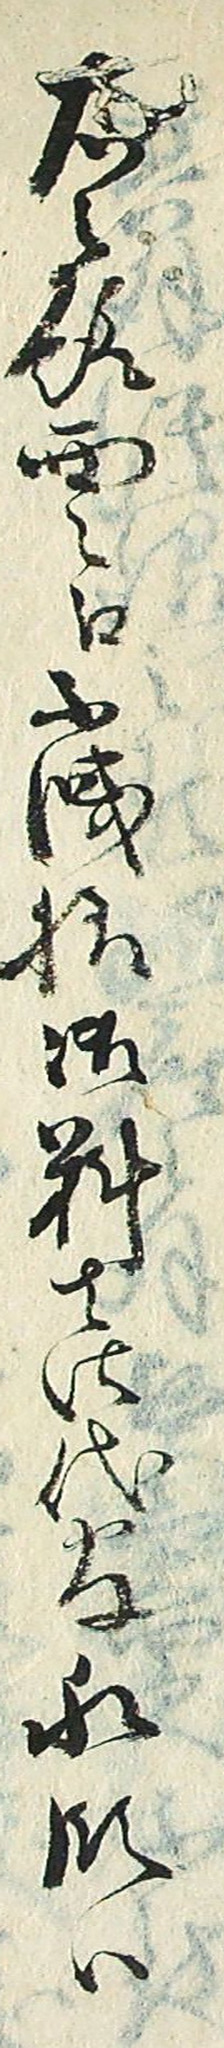右之趣面々江不洩様御料者御代官私領は
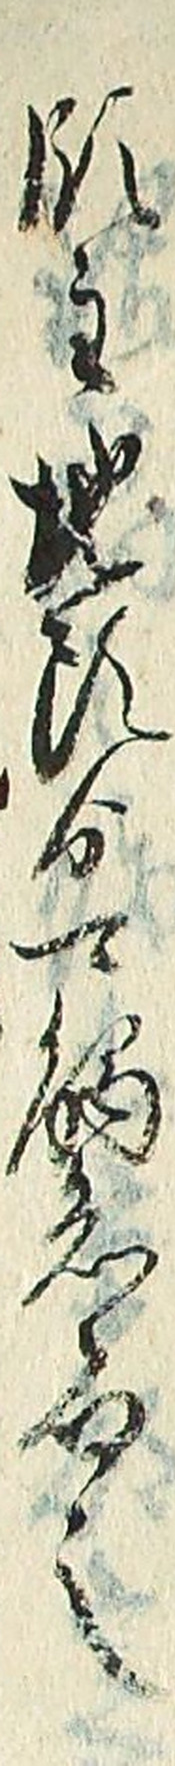領主地頭ゟ可触知者也
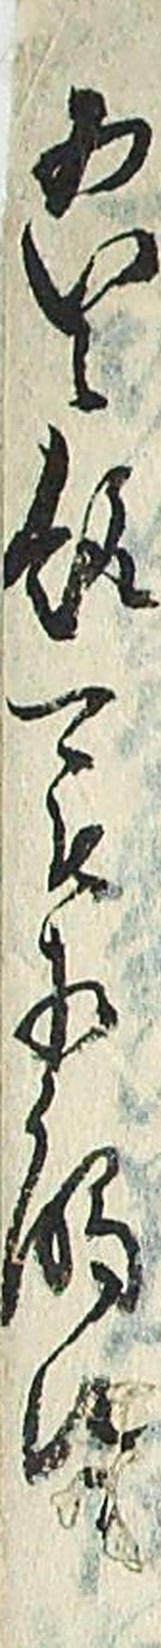右之趣可被相触候

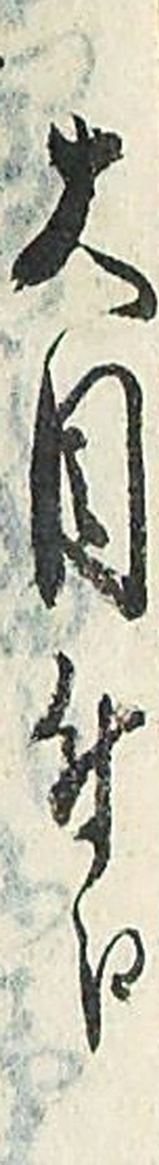大目付江
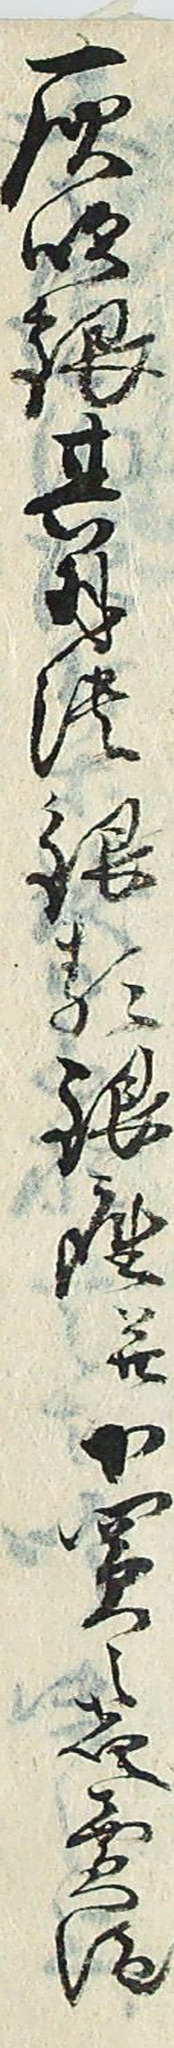灰吹銀其外潰銀類銀座幷下買之者へ売渡
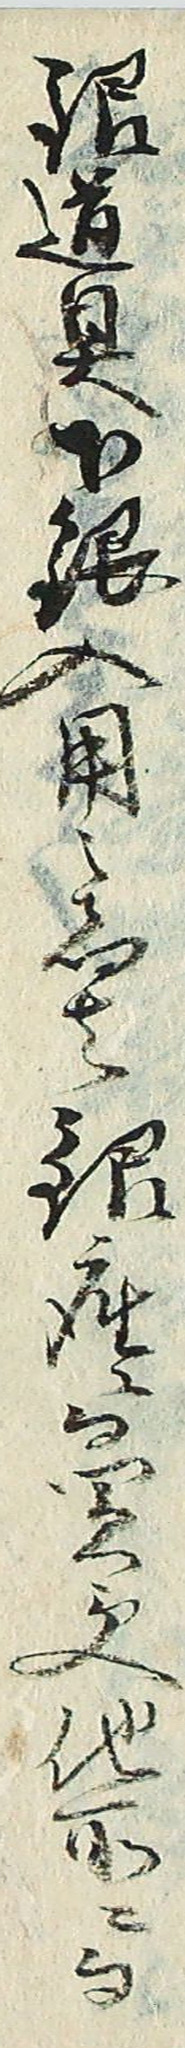銀道具下銀入用之者は銀座に而買受他所に而
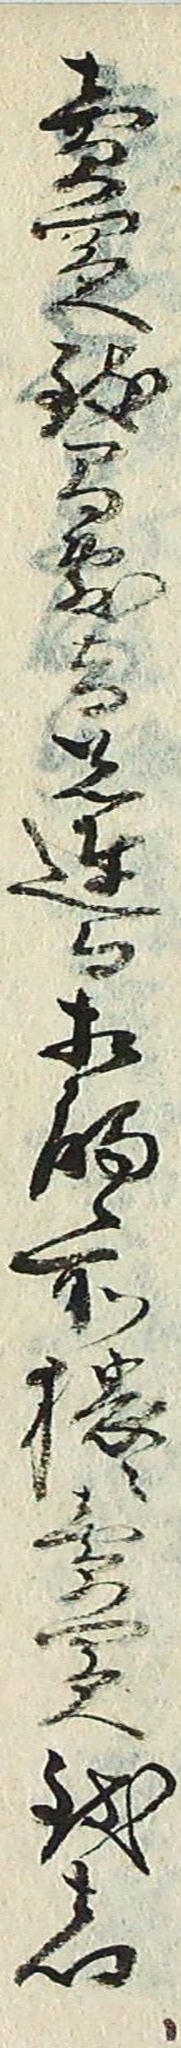売買致間敷旨先達而相触候所猥に売買致者
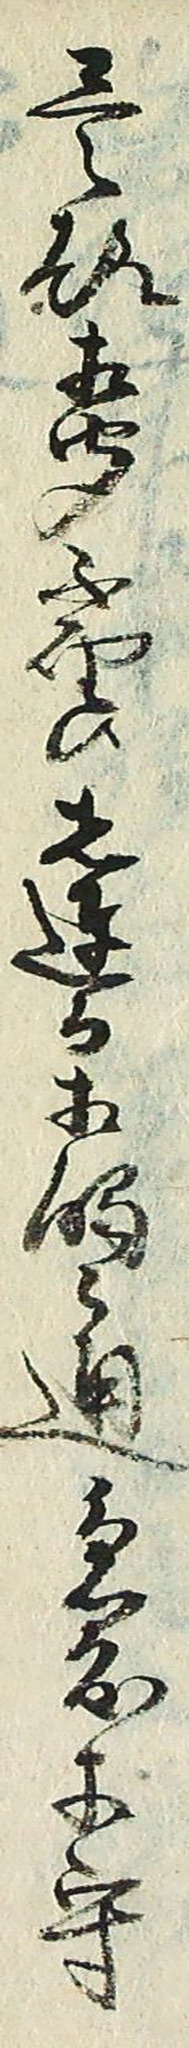有之趣相聞不届候先達而相触之通急度相守
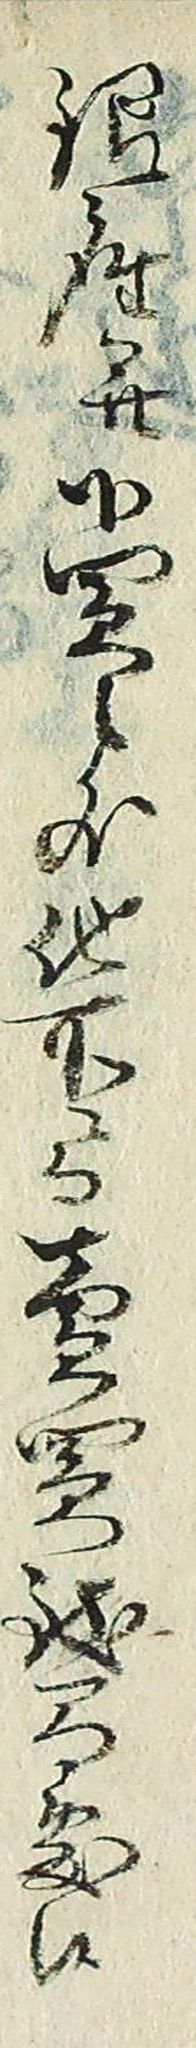銀座幷下買之外他所に而売買致間敷候
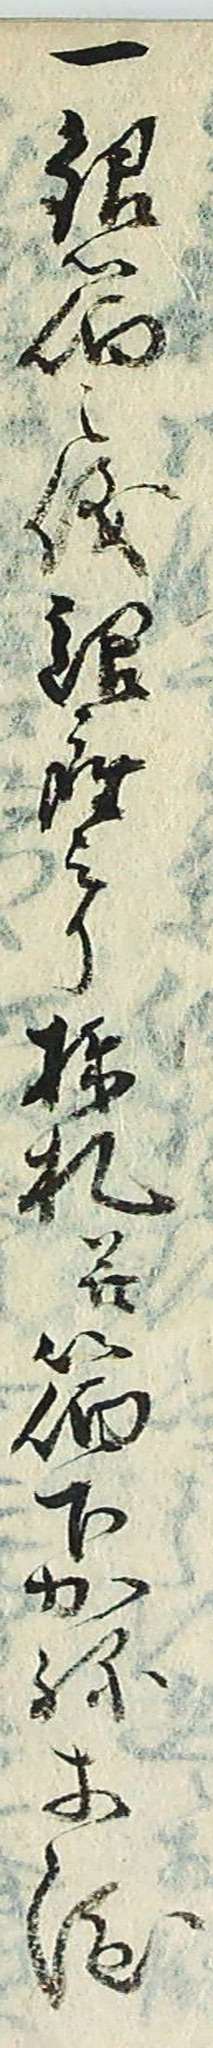一銀箔之儀銀座より株札幷箔下かね相渡
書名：諸御用御□受書控
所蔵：鳴門教育大学 Naruto University of Education
